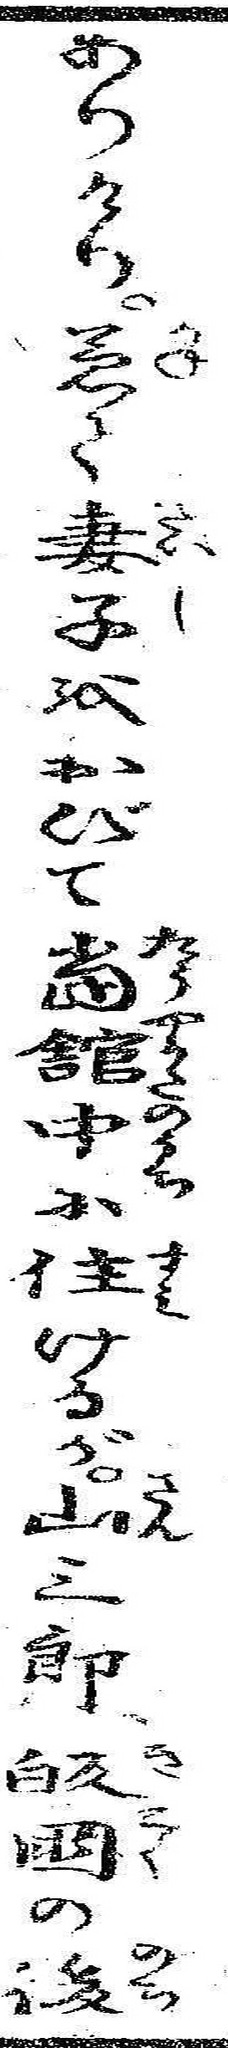ありけり。兼て妻子をおびて当館中に住けるが。山三郎帰国の後
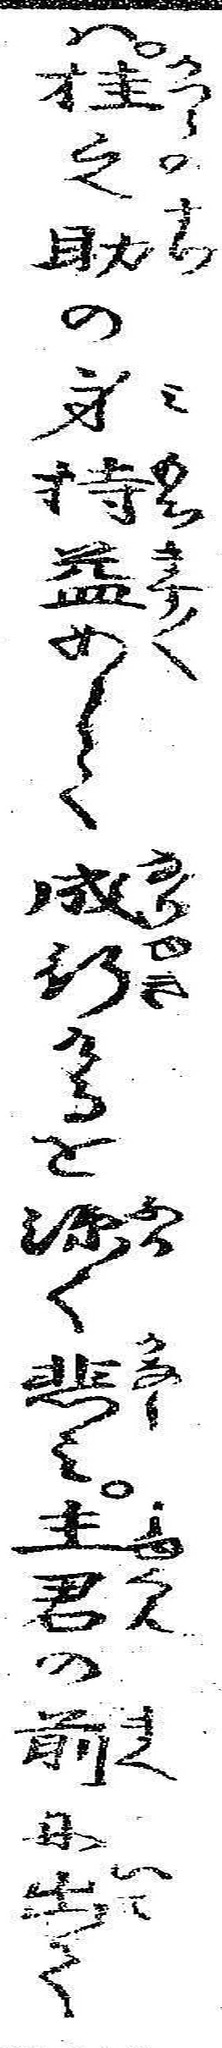は。桂之助の身持益あしく成行けるを深く悲み。主君の前に出て
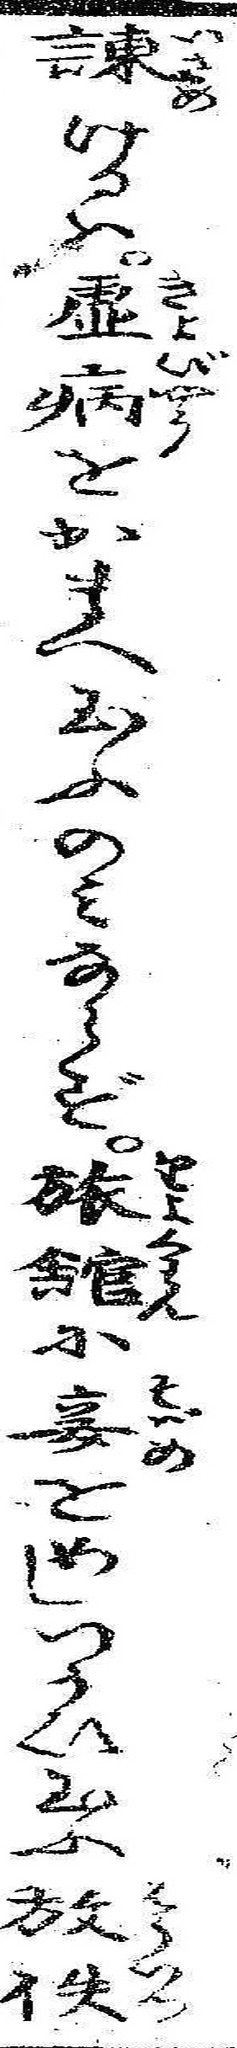諌けるは。虚病をかまへ玉ふのみならず。旅館に妾をめしつかひ玉ふ放佚
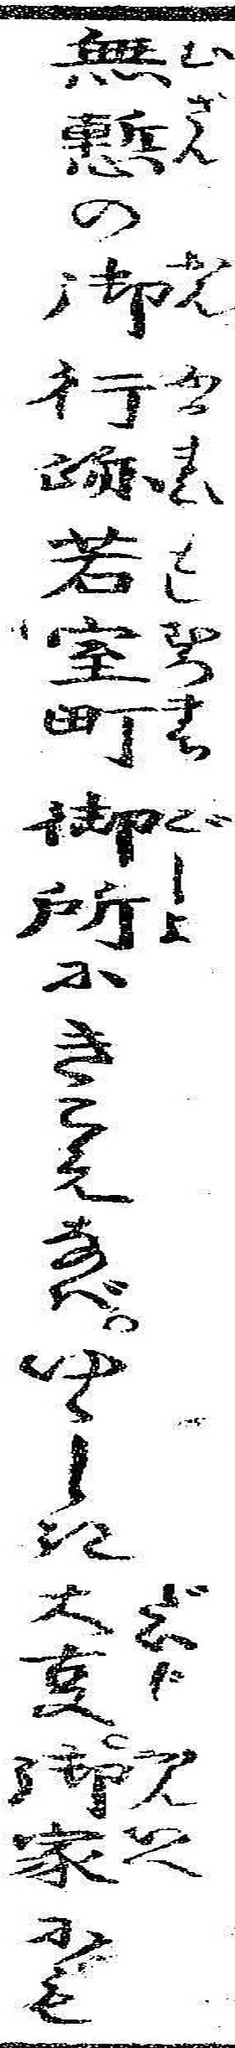無慙の御行跡若室町御所にきこえなば。ゆゝしき大事。御家にも
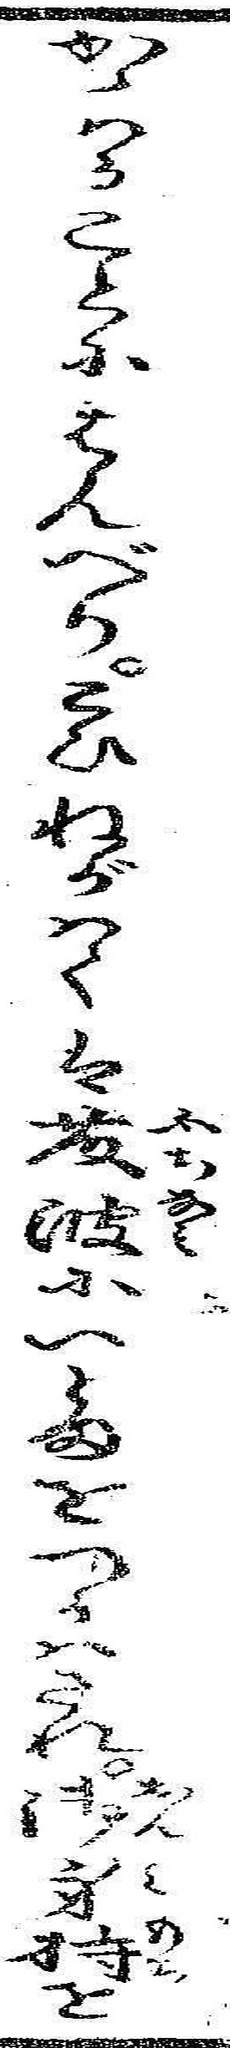かゝはることにはんべり。こひねがはくは藤波にいとまをつかはされ。御身持を
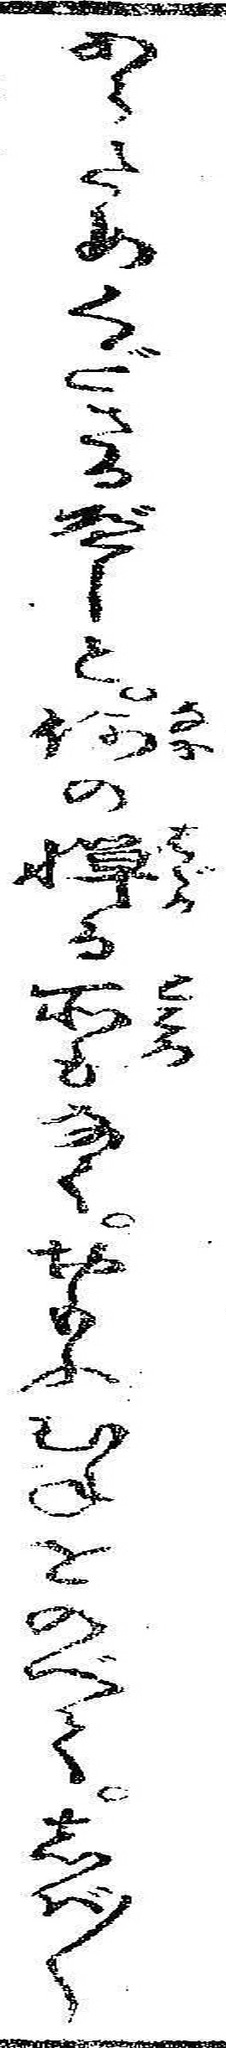あらためくださるべしと。何の憚る所もなく。おもふむねをのべて。しば〳〵
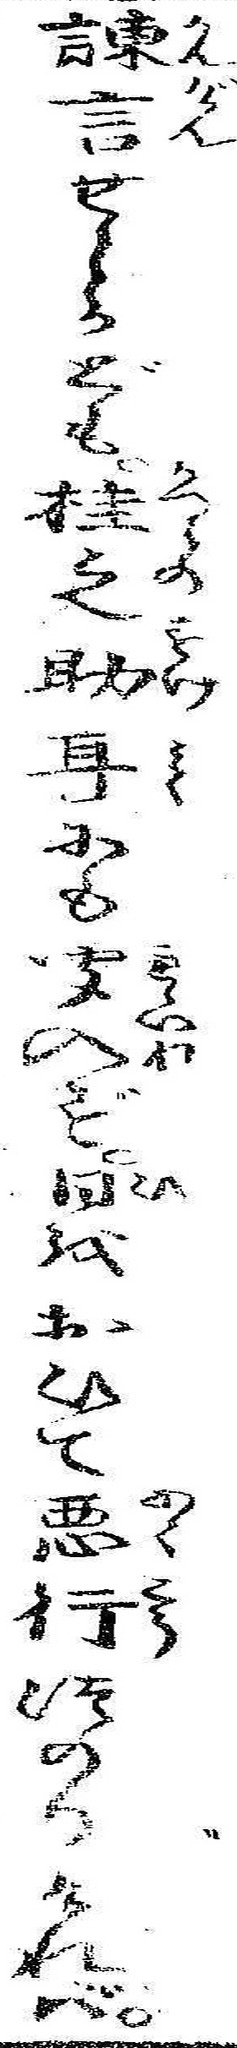諌言せしかども。桂之助耳にも聞入ず。日をおひて悪行つのりければ。
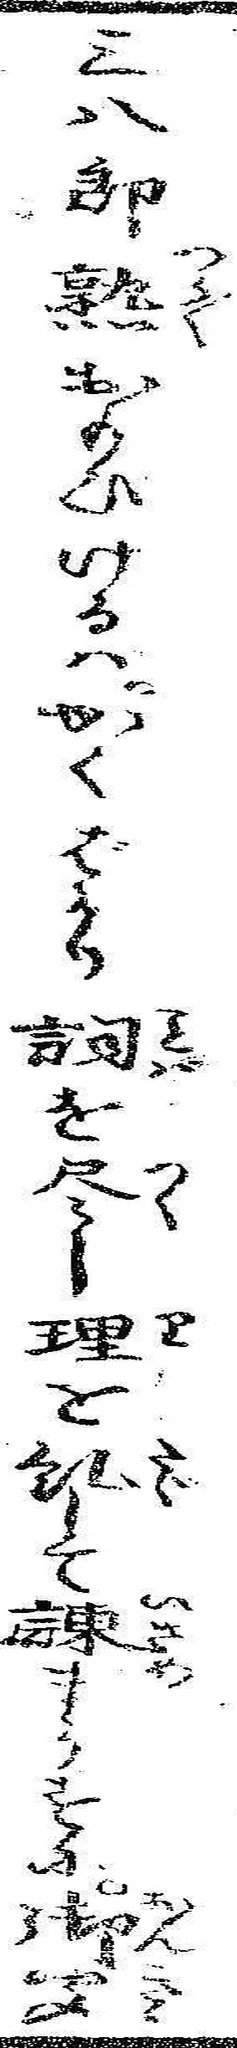三八郎熟おもひけるは。かくばかり詞を尽し理を糺して諌まうすに。御聞
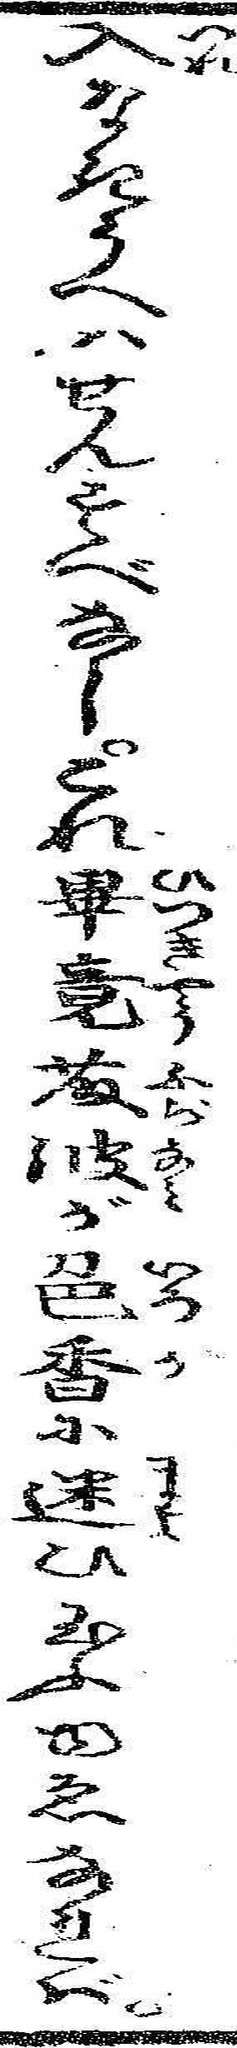入なきうへはせんすべなし。これ畢竟藤波が色香に迷ひ玉ふゆゑなれば。

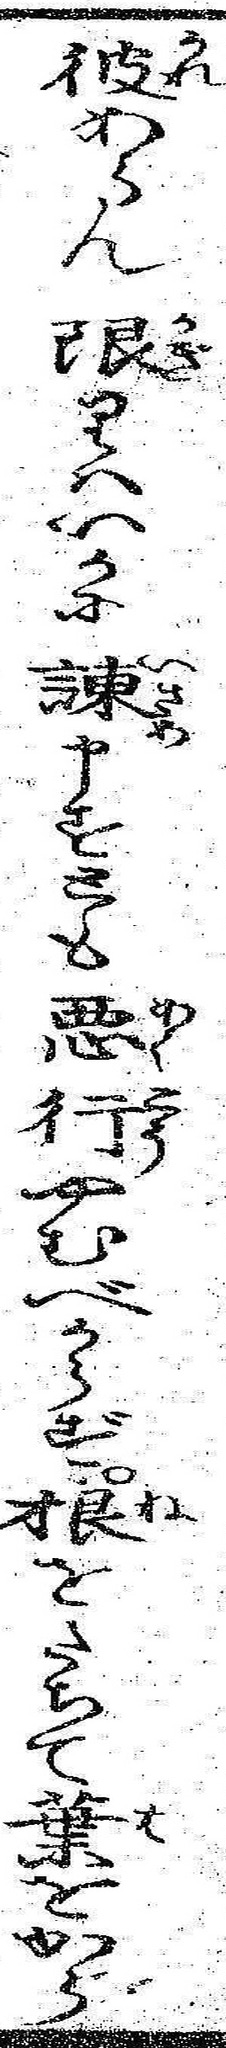彼あらん限りはいかに諌申すとも悪行やむべからず。根をたちて葉をから
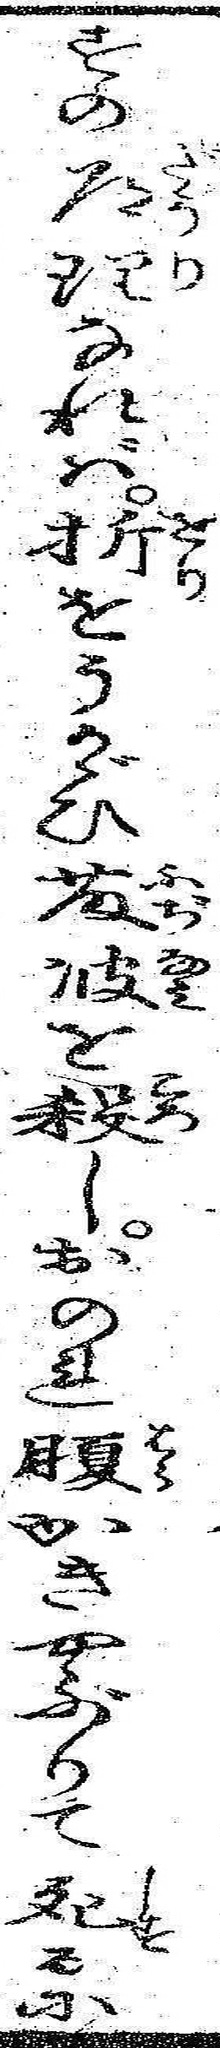すの道理なれば。折をうかゞひ藤波を殺し。おのれ腹かきやぶりて死るに
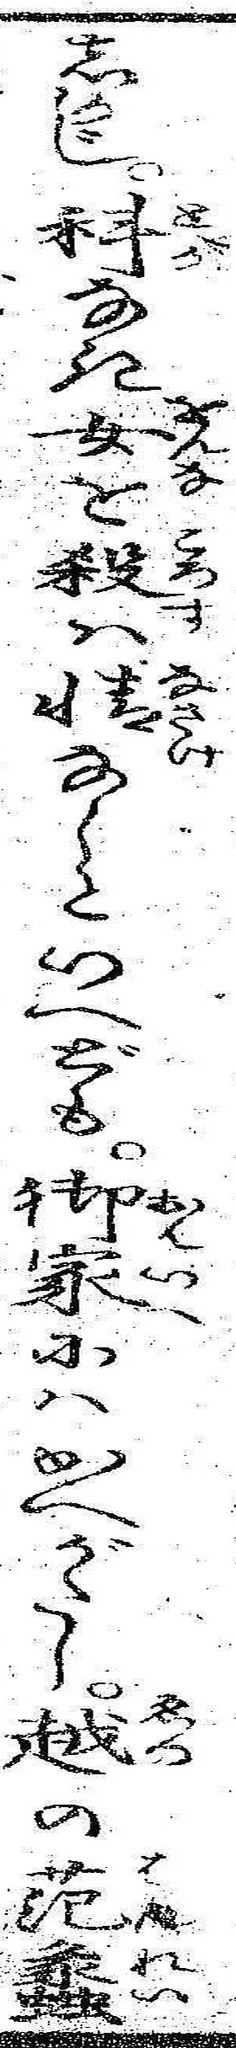しかじ。科なき女を殺は情なしといへども。御家にはかへがたし。越の范蠡
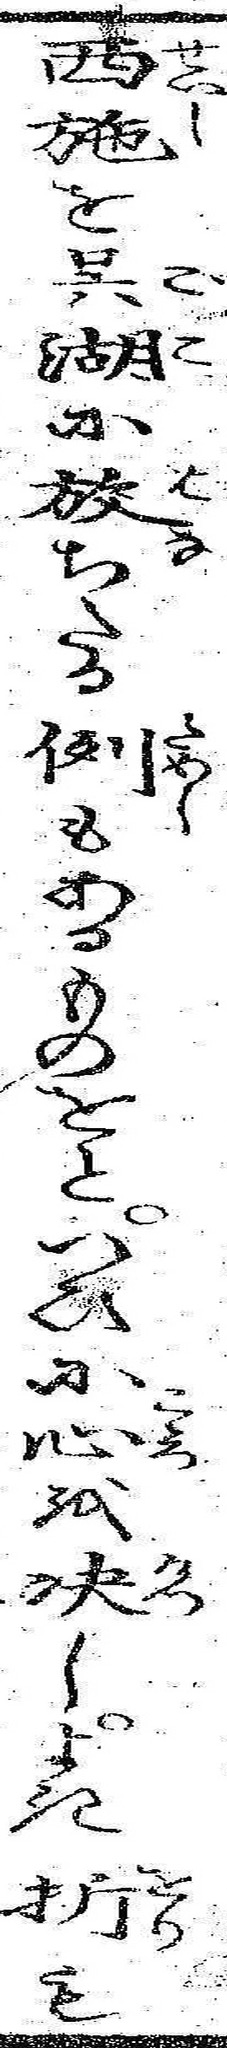西施を呉湖に放ちたる例もあるものをと。つひに心を決し。よき折も
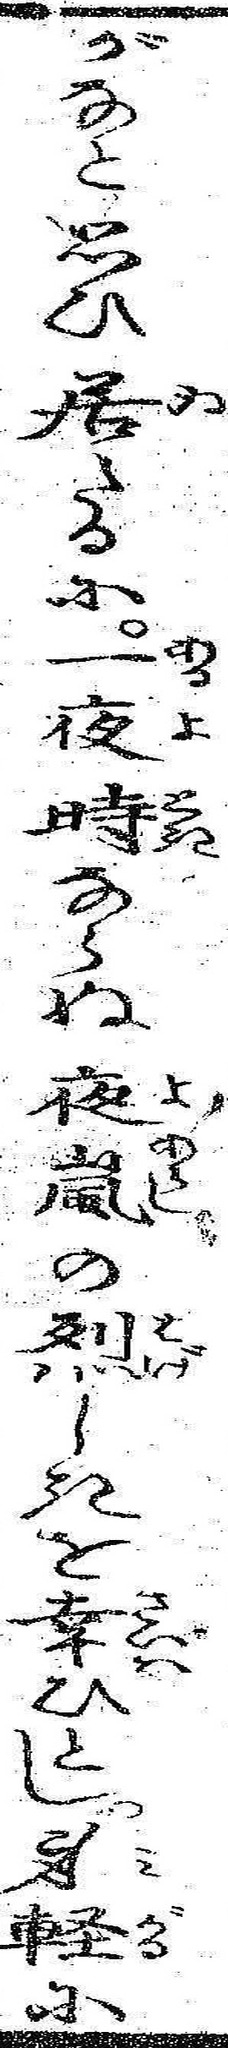がなと思ひ居たるに。一夜時ならぬ夜嵐の烈しきを幸ひとし。身軽に
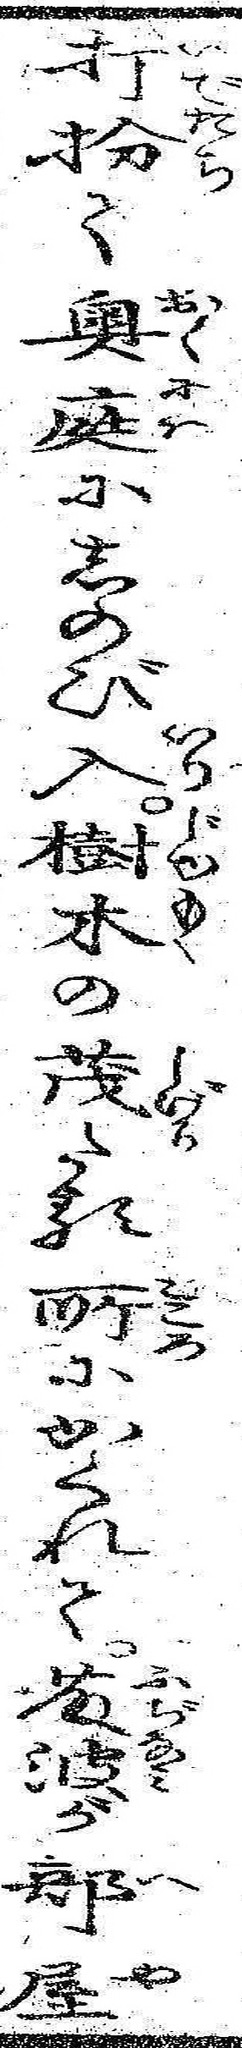打扮て奥庭にしのび入。樹木の茂たる所にかくれて。藤波が部屋
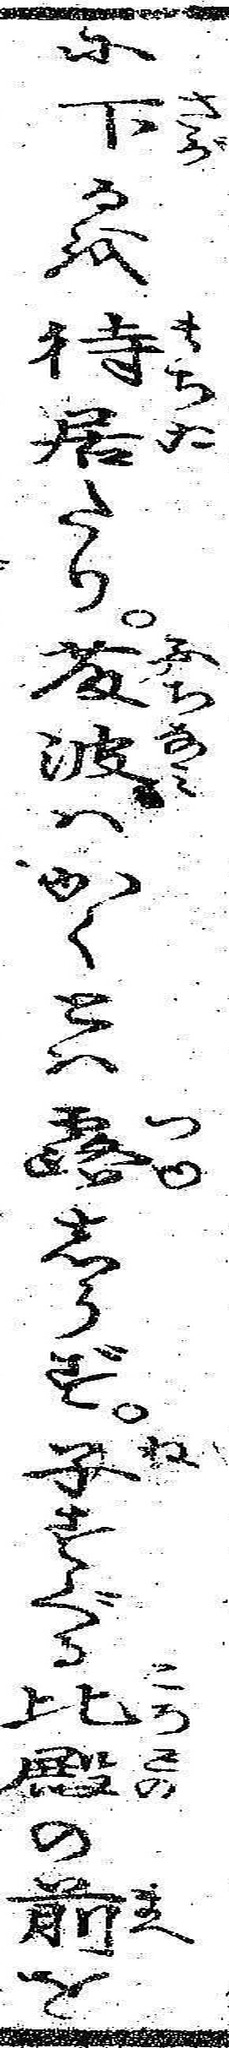に下るを待居たり。藤波はかくとは露しらず。子すぐる比殿の前を
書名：昔話稲妻表紙
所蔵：国文学研究資料館
